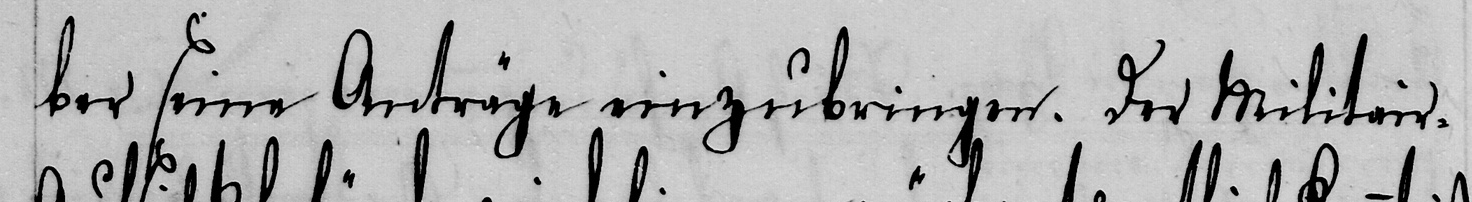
ber seine Anträge einzubringen. Der Militai¬
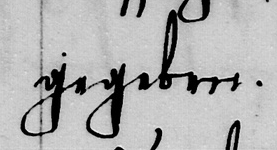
gegeben.
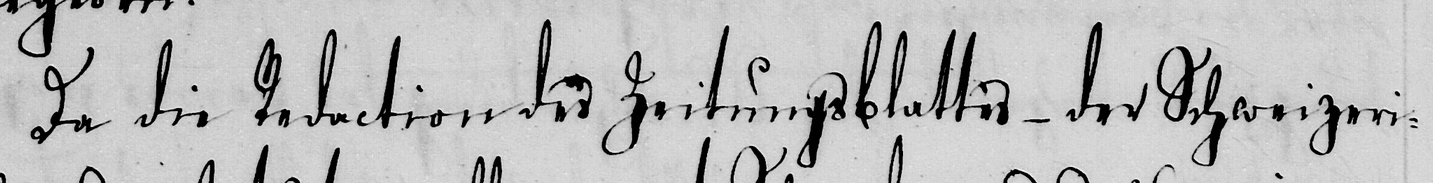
Da die Redaction des Zeitungsblattes – der Schweizeri¬
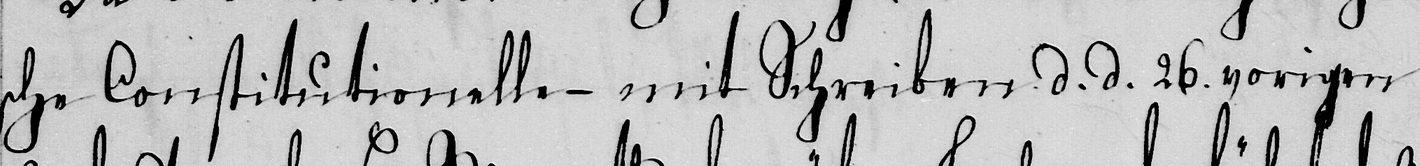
che Constitutionelle – mit Schreiben d. d. 26. vorigen
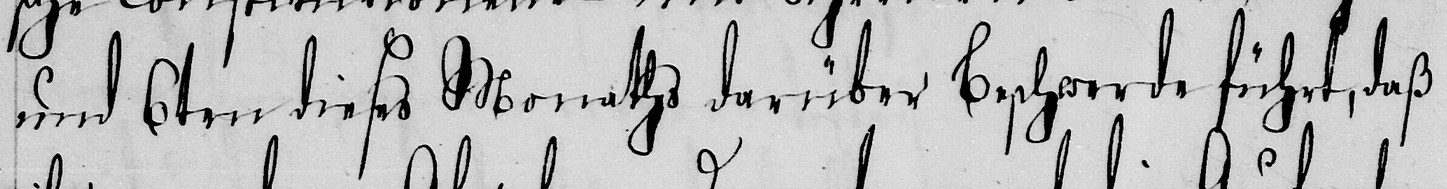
und 6ten dieses Monaths darüber Beschwerde führt, daß
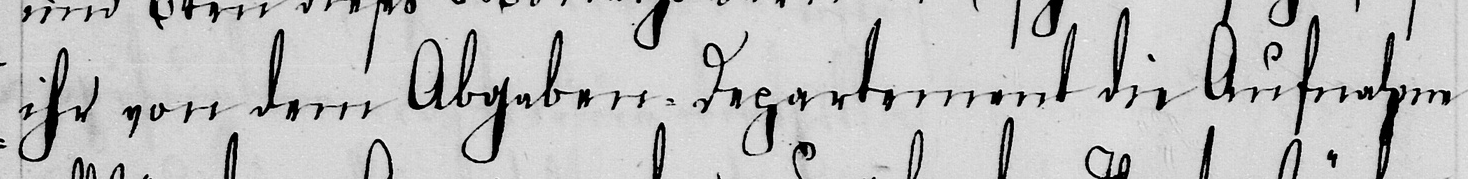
ihr von dem Abgaben-Departement die Aufnahme
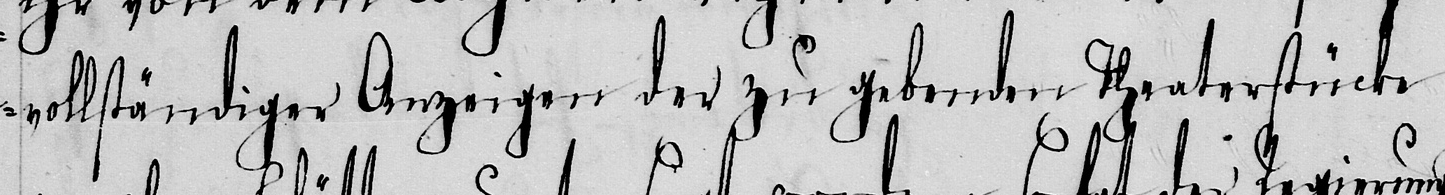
vollständiger Anzeigen der zu gebenden Theaterstücke
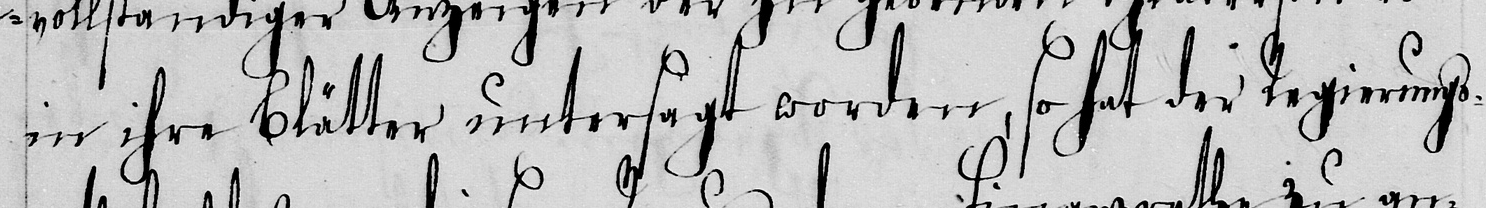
in ihre Blätter untersagt worden, so hat der Regierung¬
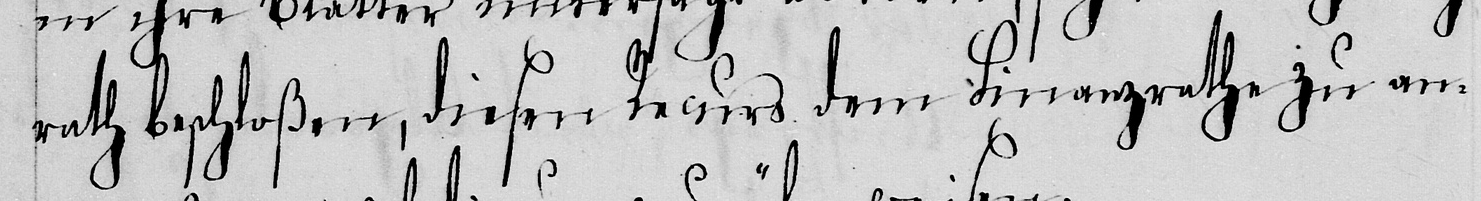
srath beschloßen, diesen Recurs dem Finanzrathe zu an¬
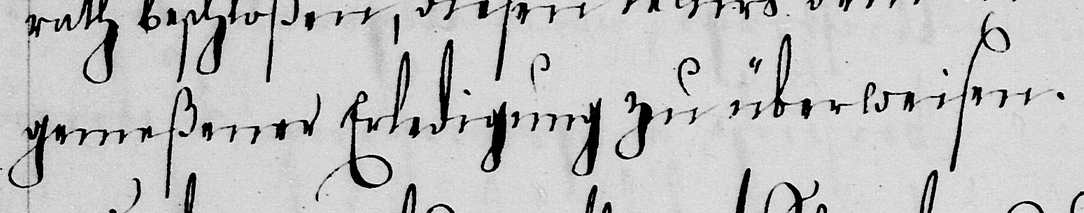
gemeßener Erledigung zu überweisen.
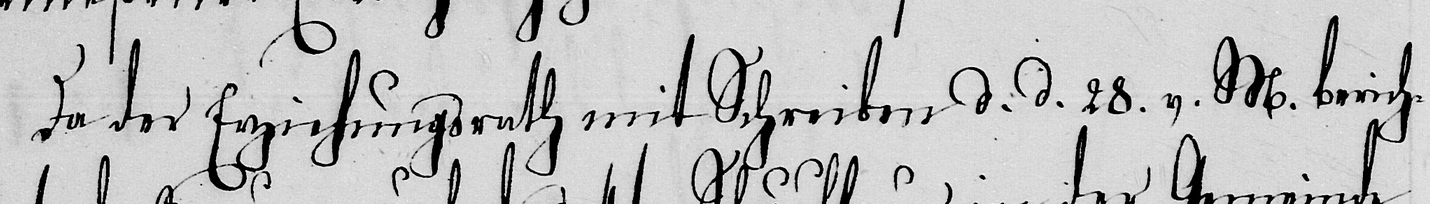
Da der Erziehungsrath mit Schreiben d. d. 28. v. M. beric¬
